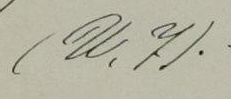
(U.7).
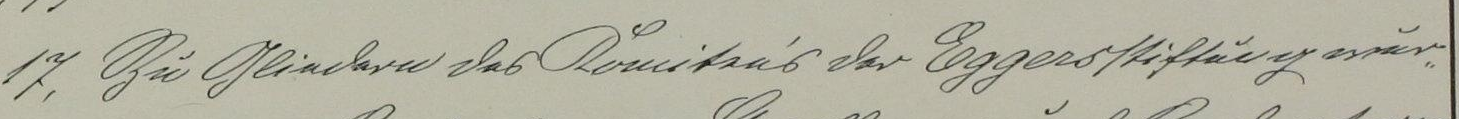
17. Zu Gliedern des Komitees der Eggersstiftung wur-
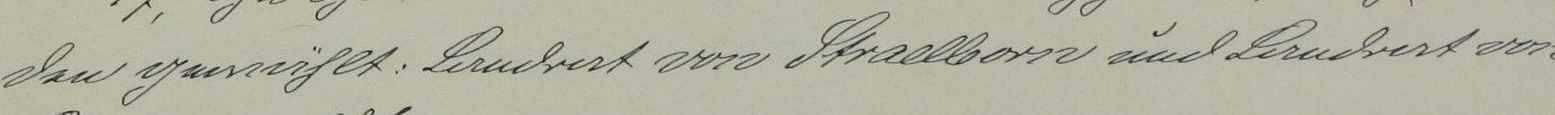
den gewählt: Landrat von Straelborn und Landrat von
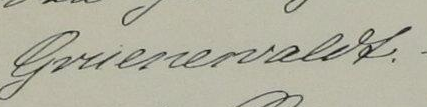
Gruenewaldt.
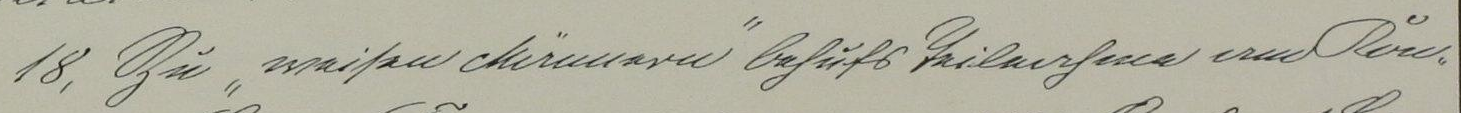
18. Zu „weisen Männern“ behufs Teilnahme am Kon-
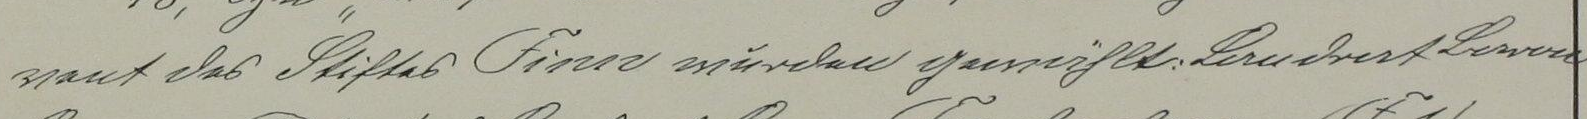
vent des Stiftes Finn wurden gewählt: Landrat Baron
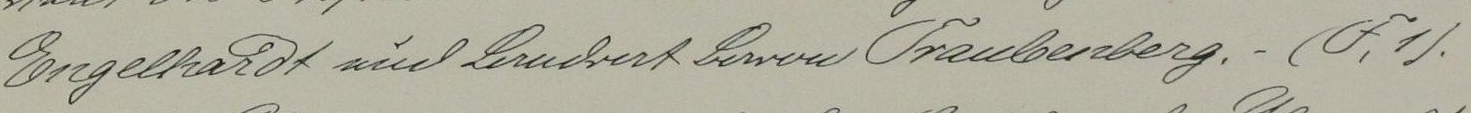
Engelhardt und Landrat Baron Traubenberg - (F.1).
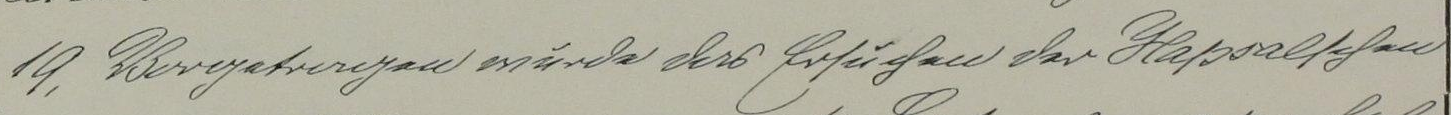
19. Vorgetragen wurde das Ersuchen der Hapsalschen
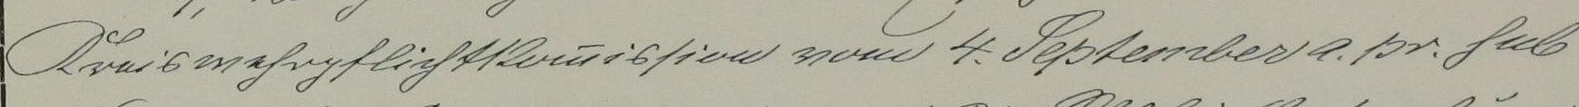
Kreiswehrpflichtkommission vom 4. September a.pr. sub
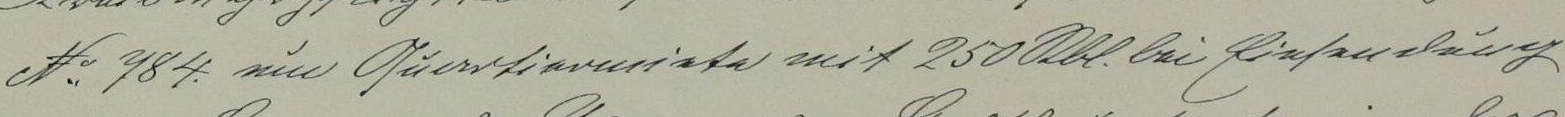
No. 784. um Quartiermiete mit 250 Rbl. bei Einsendung
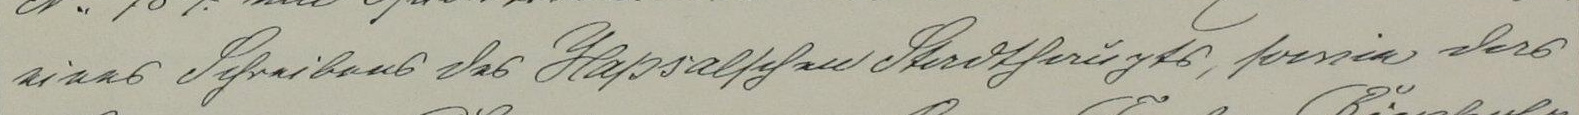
eines Schreibens des Hapsalschen Stadthaupts, sowie das
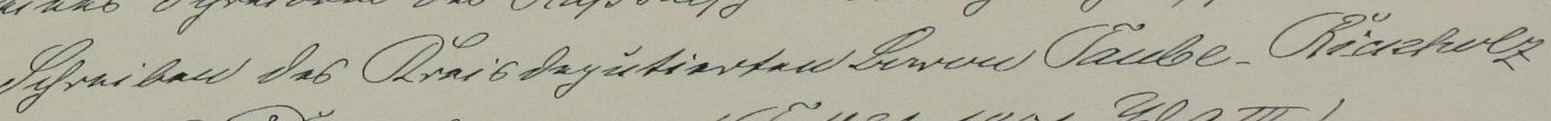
Schreiben des Kreisdeputierten Baron Taube-Rickholz
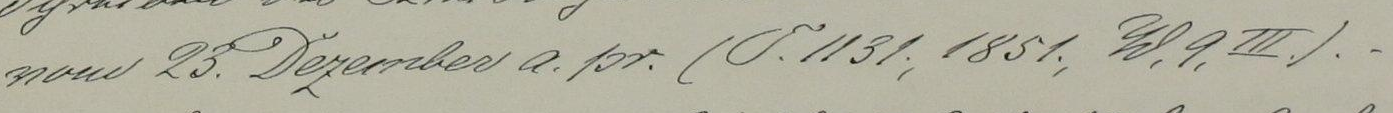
vom 23. Dezember a.pr. (T.1131., 1851., W.9. III).
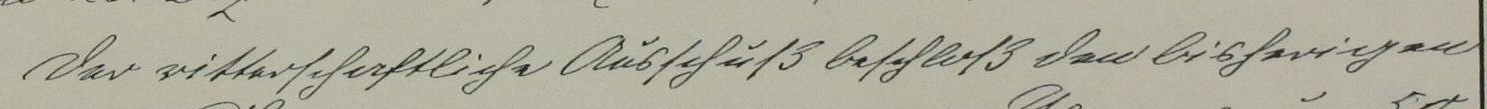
Der ritterschaftliche Ausschuß beschloß den bisherigen
